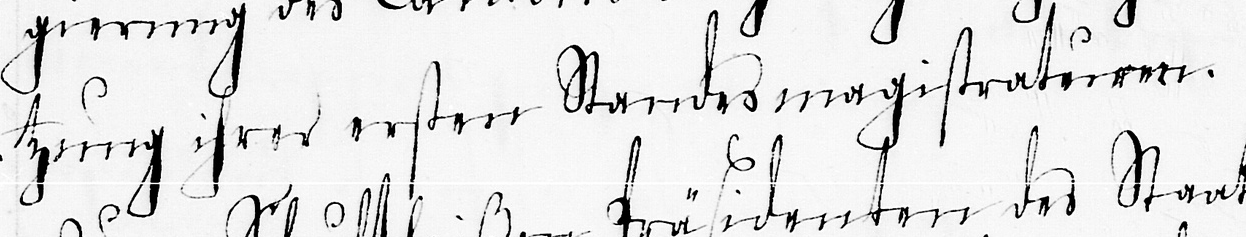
tzung ihrer ersten Standesmagistraturen.
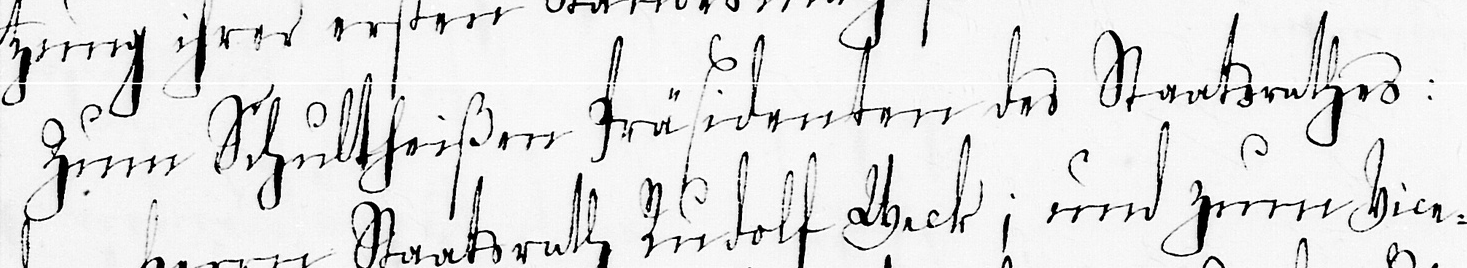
Zum Schultheißen Präsidenten des Staatsrathes:
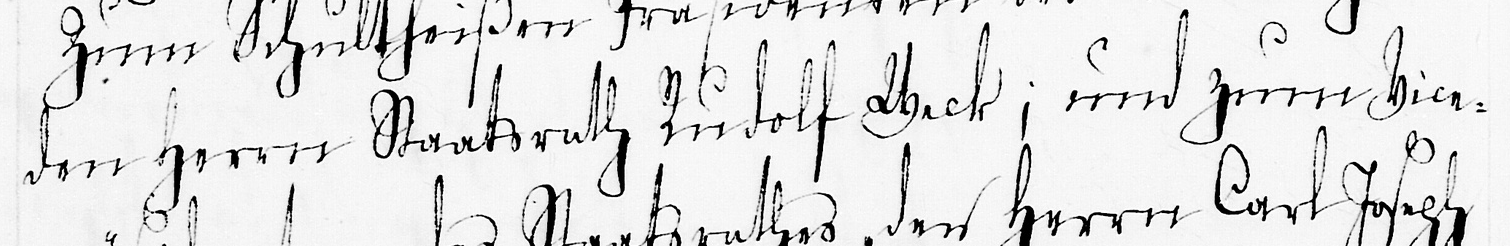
den Herrn Staatsrath Rudolf Weck; und zum Vice¬
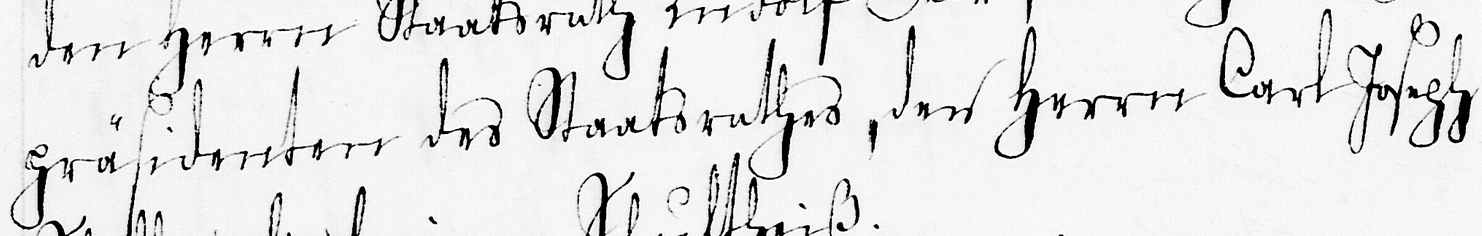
präsidenten des Staatsrathes, den Herrn Carl Joseph
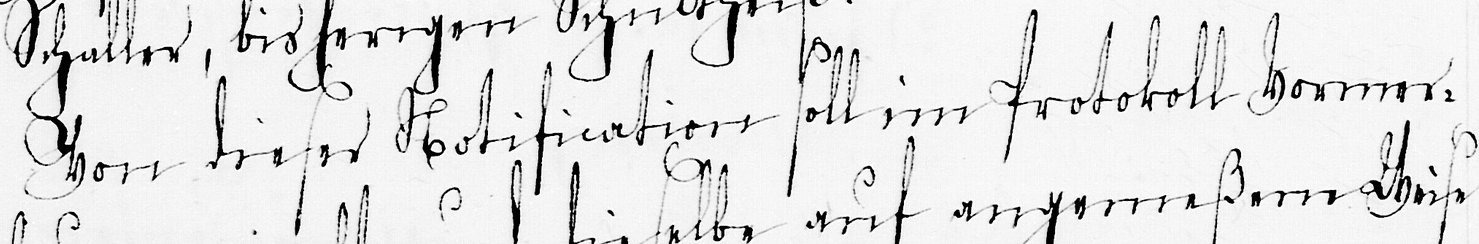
Von dieser Notification soll im Protokoll Vormer¬
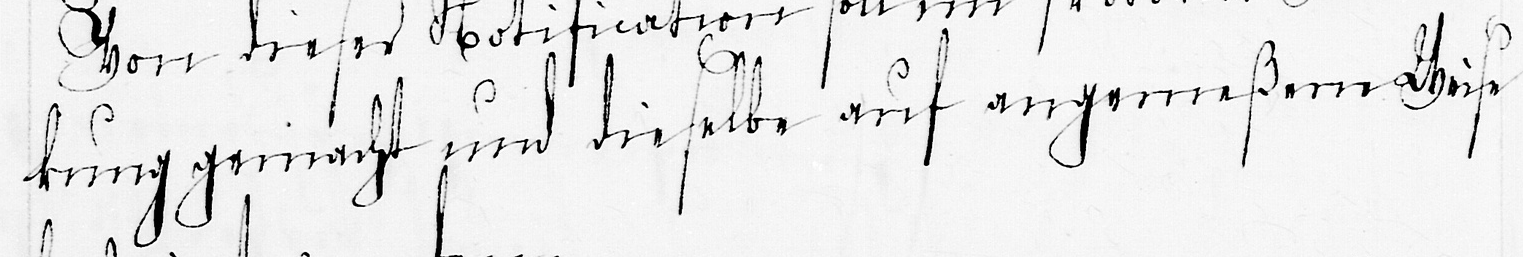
kung gemacht und dieselbe auf angemeßene Weise
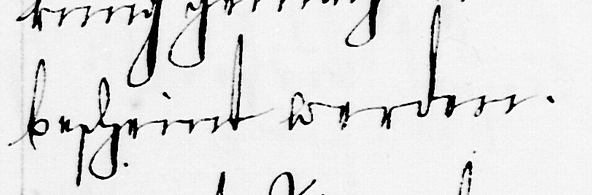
bescheint werden.
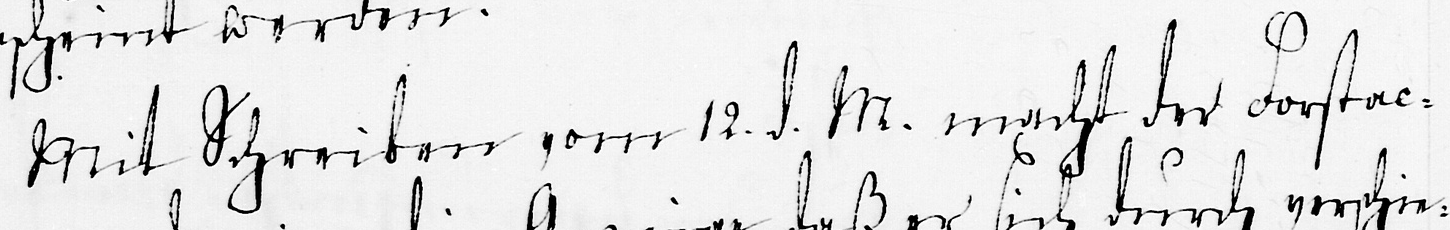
Mit Schreiben vom 12. d. M. macht der Forstac¬
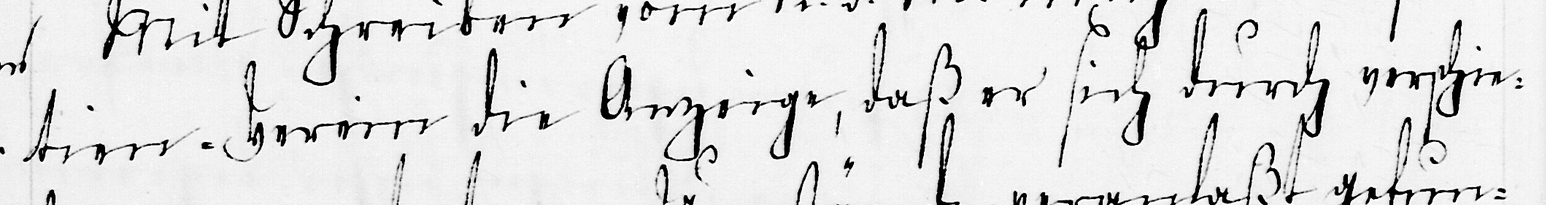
tien-Verein die Anzeige, daß er sich durch verschie¬
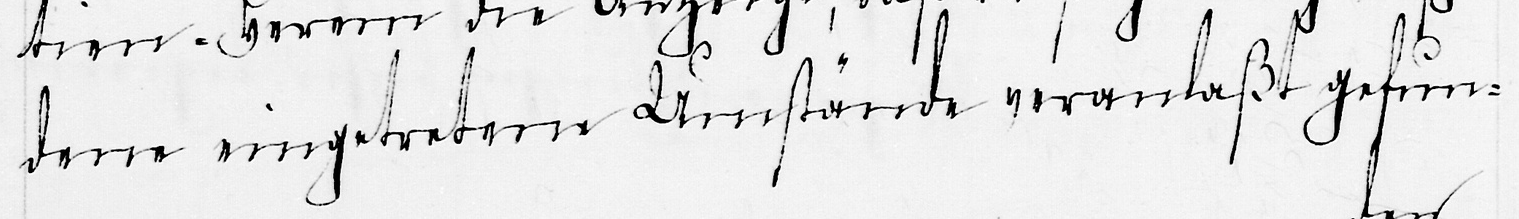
dene eingetretene Umstände veranlaßt gefun-
